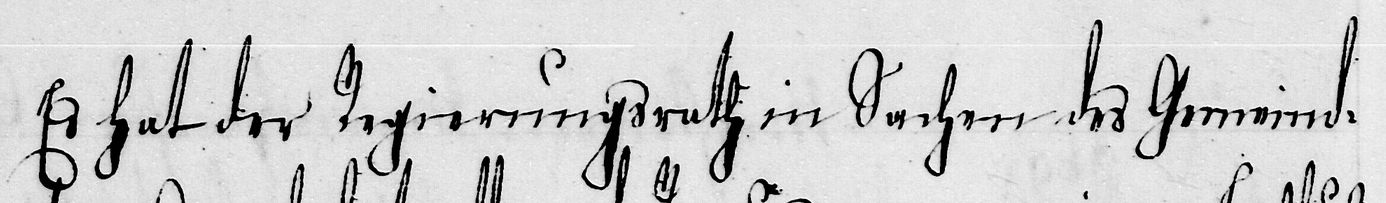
Es hat der Regierungsrath in Sachen des Gemeind¬
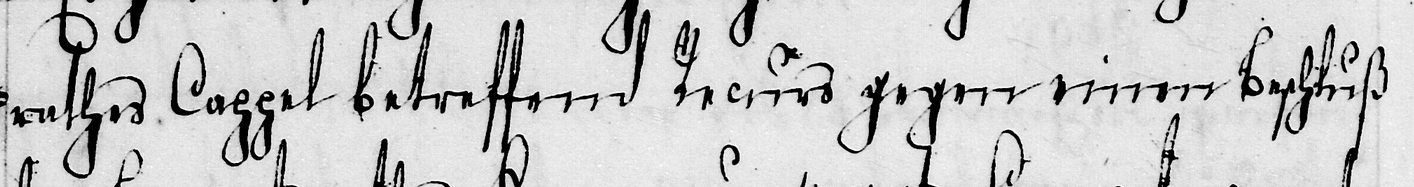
rathes Cappel betreffend Recurs gegen einen Beschluß
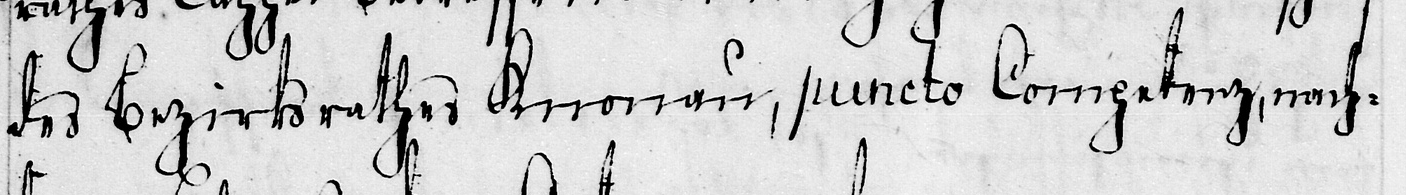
des Bezirksrathes Knonau, puncto Competenz, nach¬
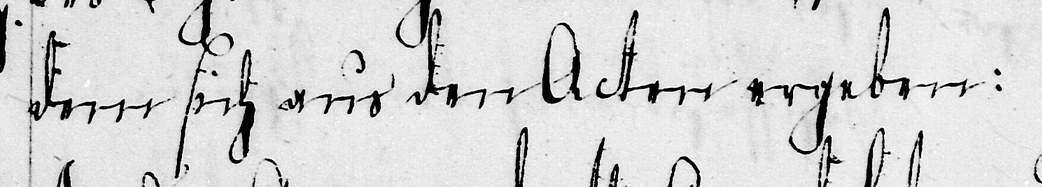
dem sich aus den Acten ergeben:
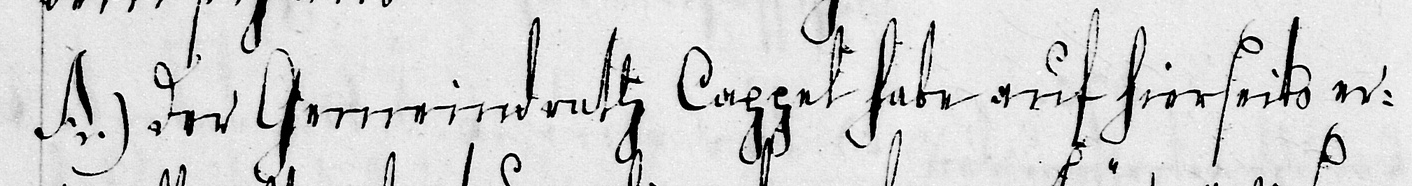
A.) Der Gemeindrath Cappel habe auf hierseits er¬
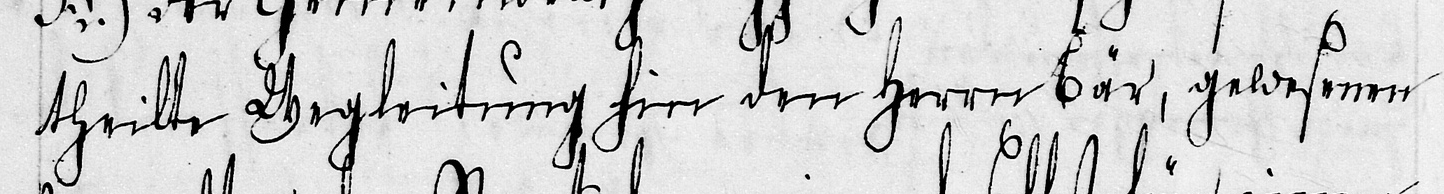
theilte Wegleitung hin den Herrn Bär, gewesenen
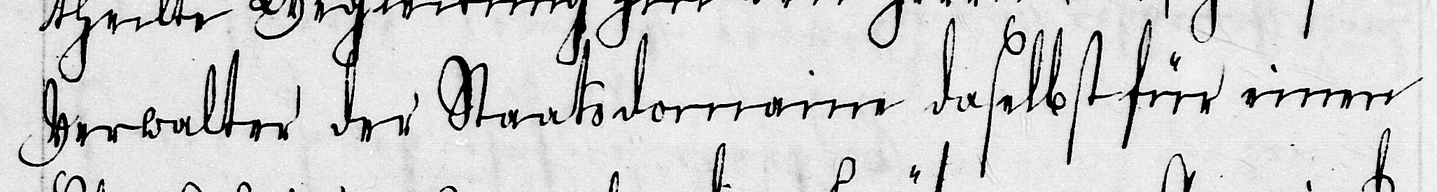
Verwalter der Staatsdomaine daselbst für einen
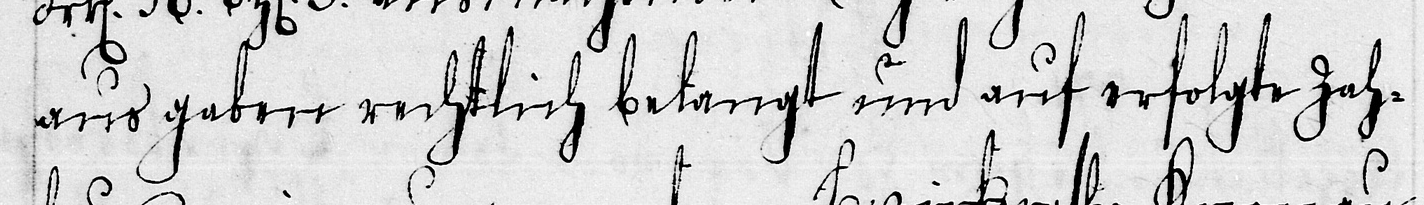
ausgaben rechtlich belangt und auf erfolgte Zah¬
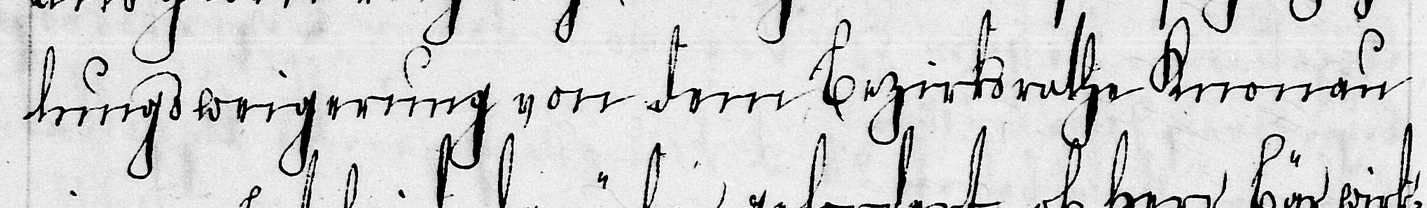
lungsweigerung von dem Bezirksrathe Knonau
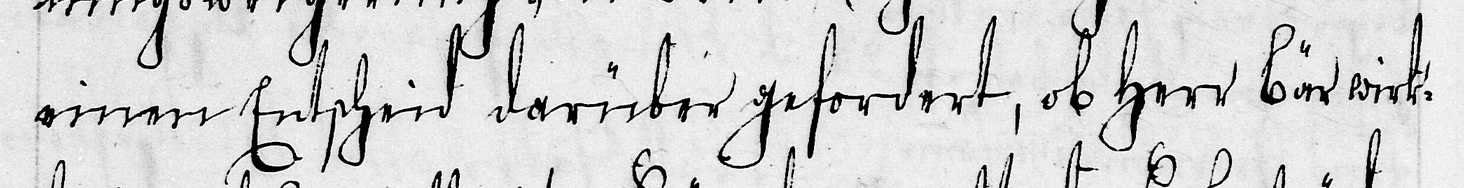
einen Entscheid darüber gefordert, ob Herr Bär wirk¬
